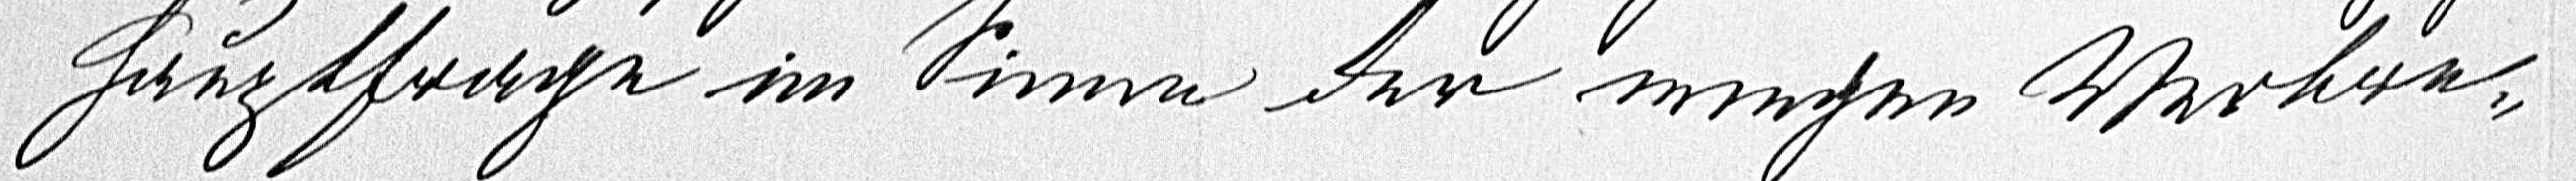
Hauptfrage im Sinne der wegen Verbre¬
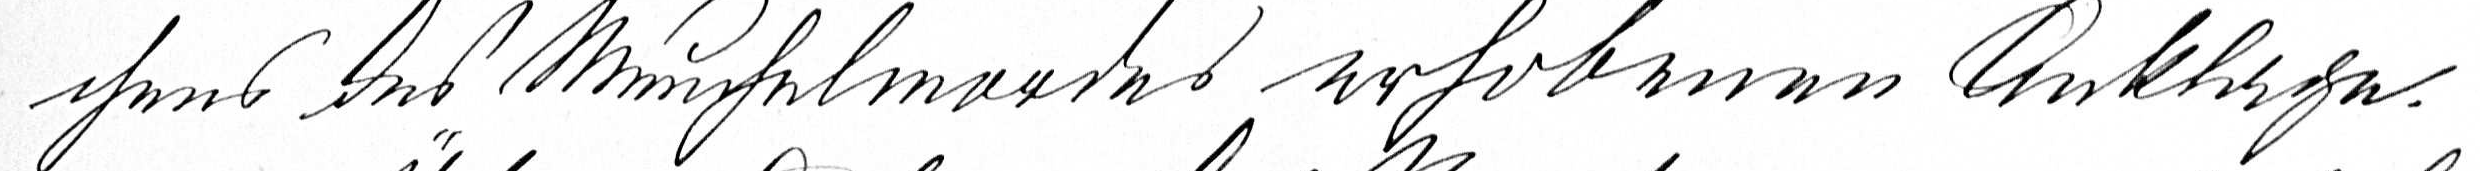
chens des Meuchelmordes erhobenen Anklage.
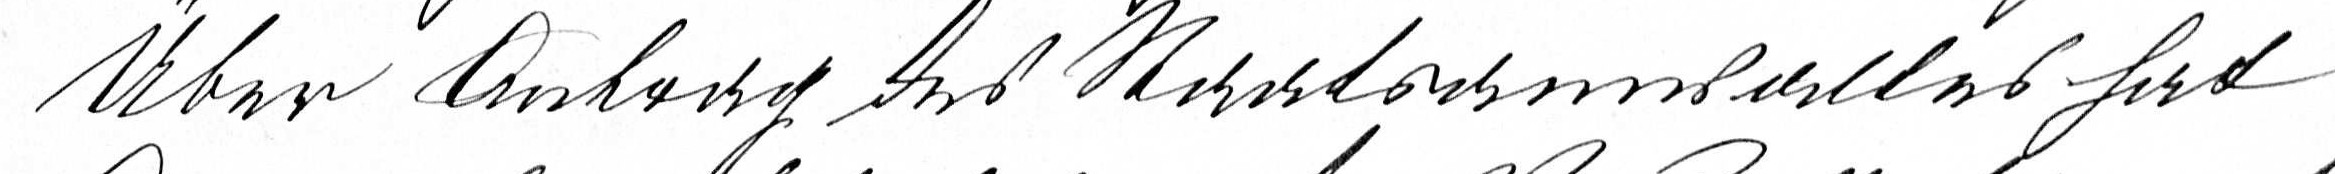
Über Antrag des Staatsanwaltes hat
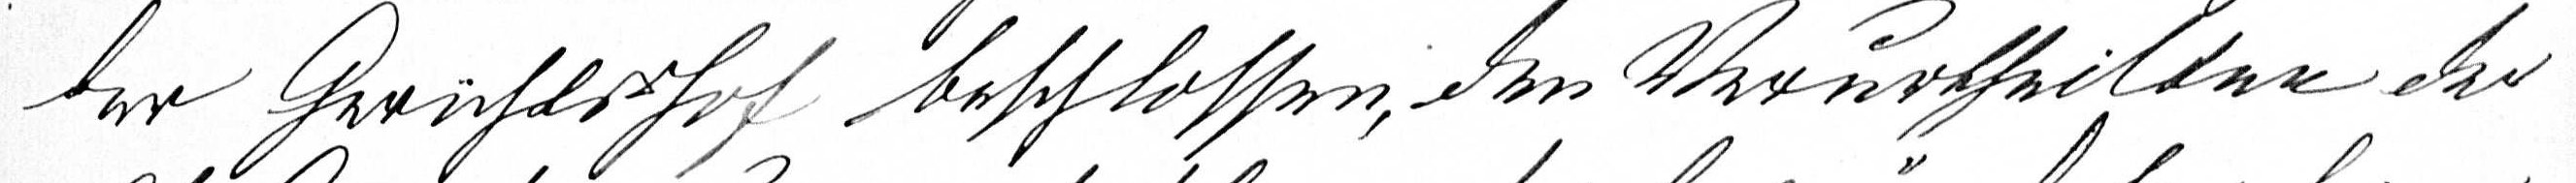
der Gerichtshof beschlossen, den Verurtheilten der
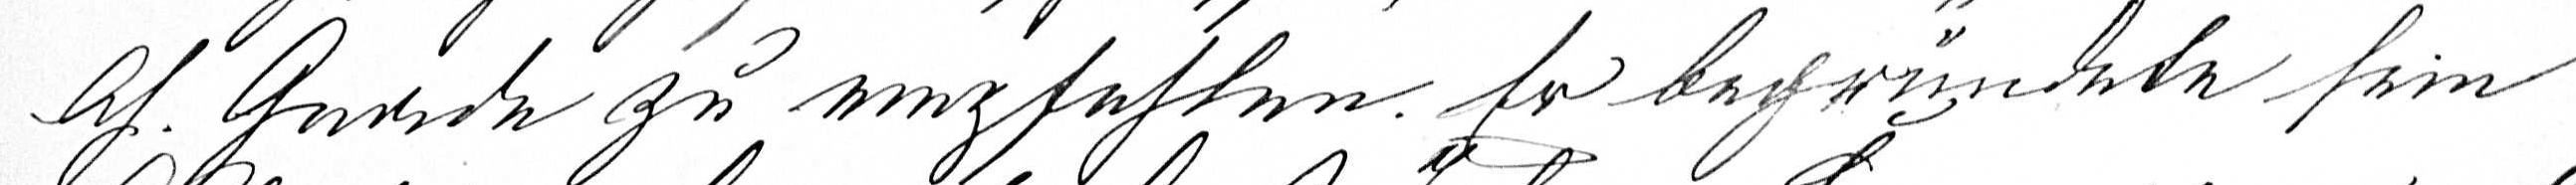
Ah. Gnade zu empfehlen. Er begründete sein
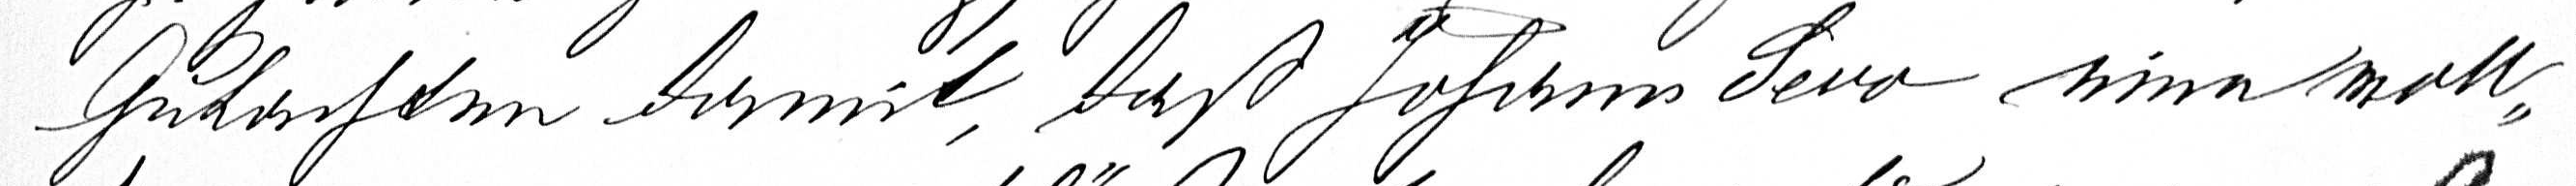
Gutachten damit, daß Johann Ševo eine voll¬
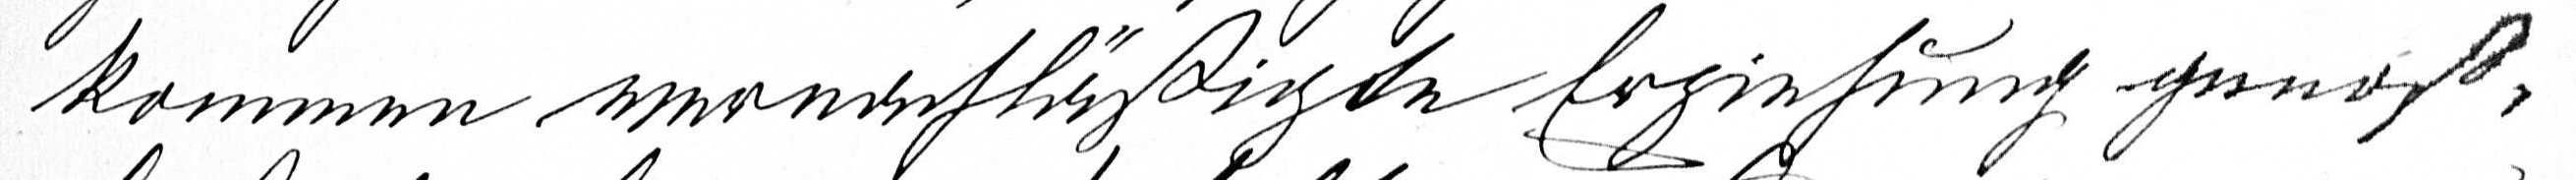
kommen vernachläßigte Erziehung genoß,
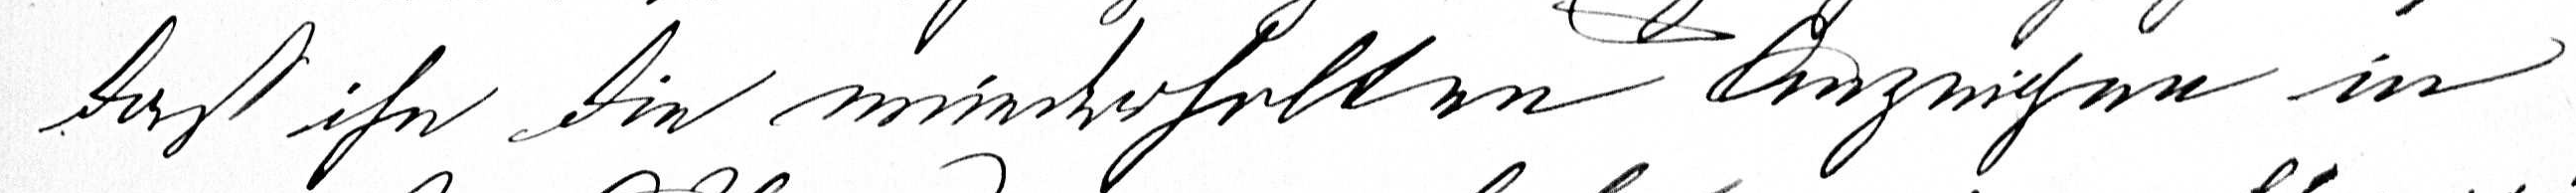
daß ihn die wiederholten Anzeigen in
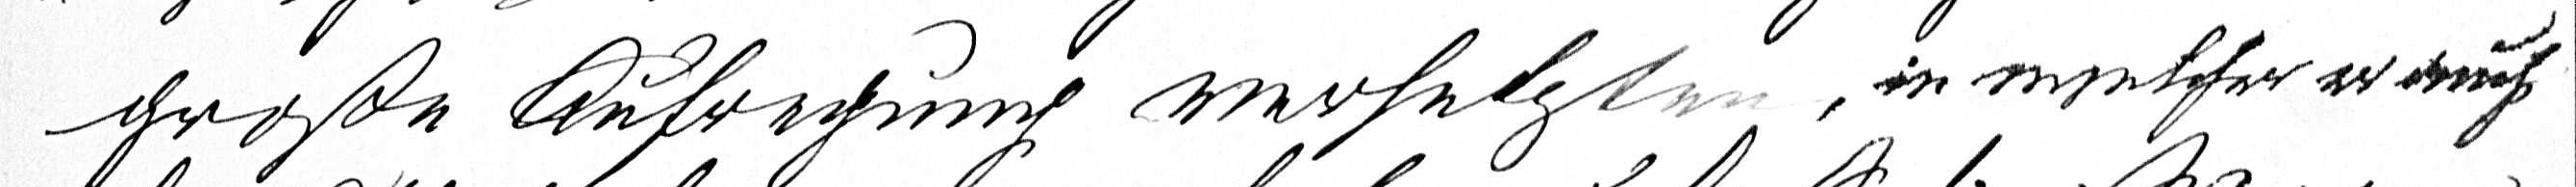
große Aufregung versetzten, in welcher er auch
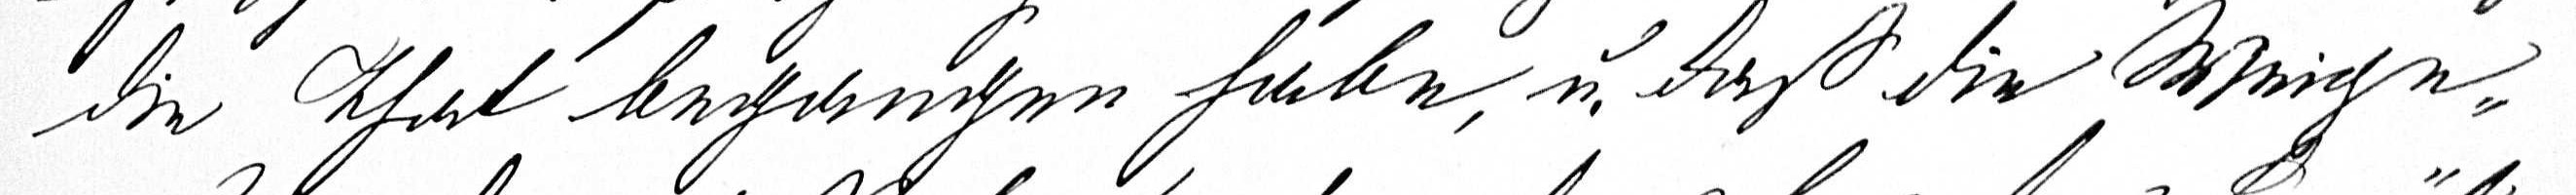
die That begangen habe, u. daß die Weige¬
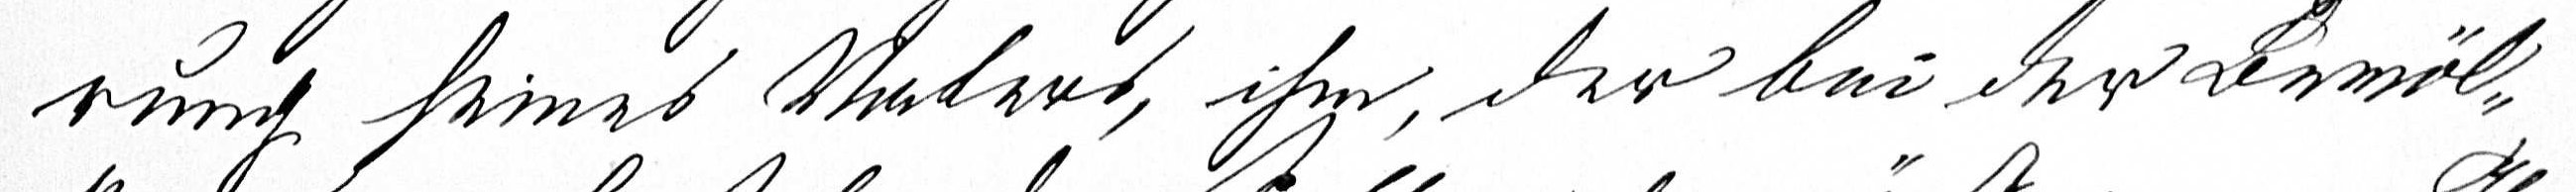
rung seines Vaters, ihm, der bei der Bevöl¬
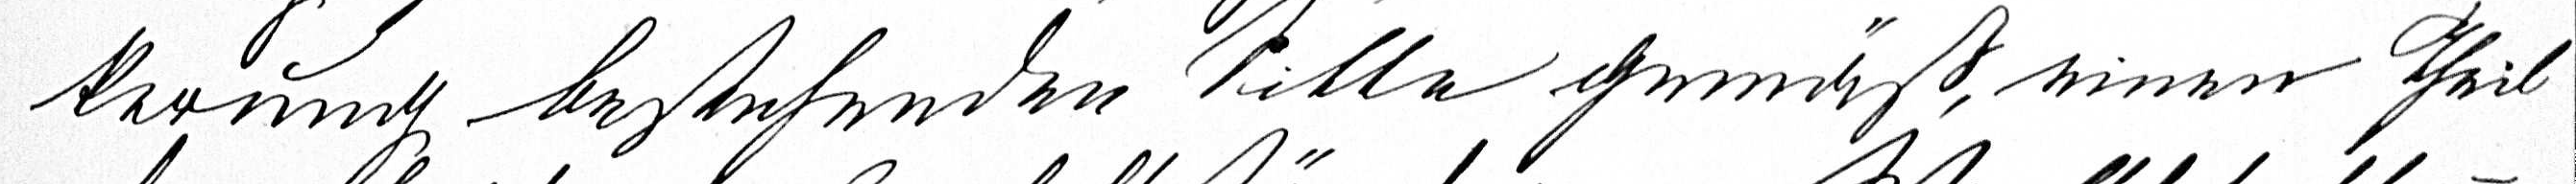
kerung bestehenden Sitte gemäß, einen Theil
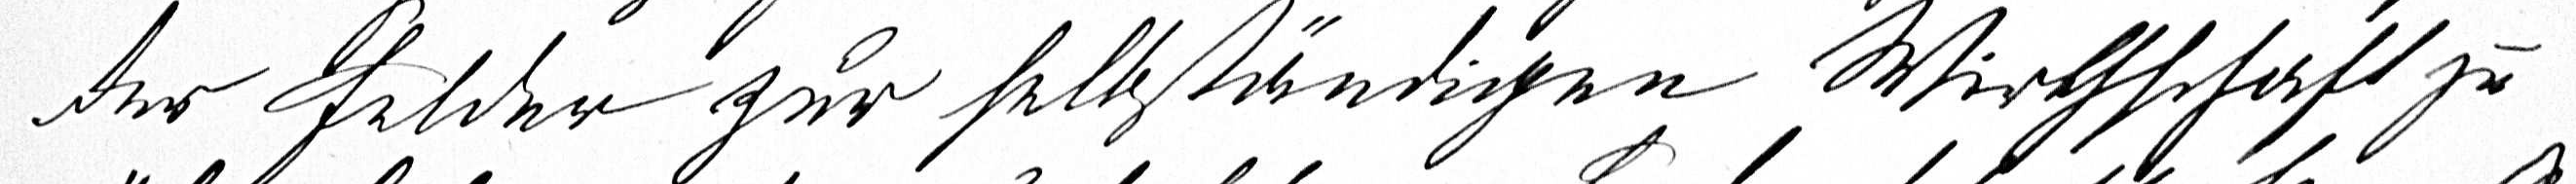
der Felder zur selbständigen Wirtschaft zu
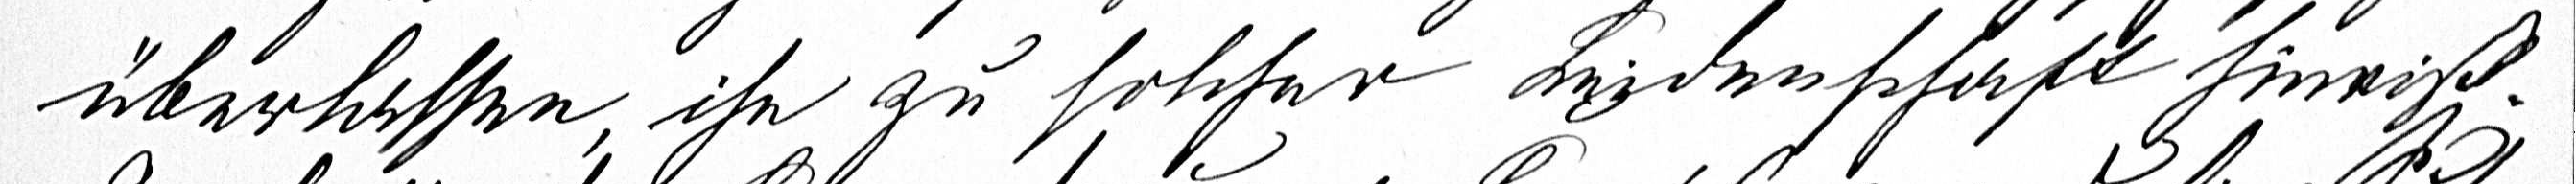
überlassen, ihn zu solcher Leidenschaft hinrieß.
